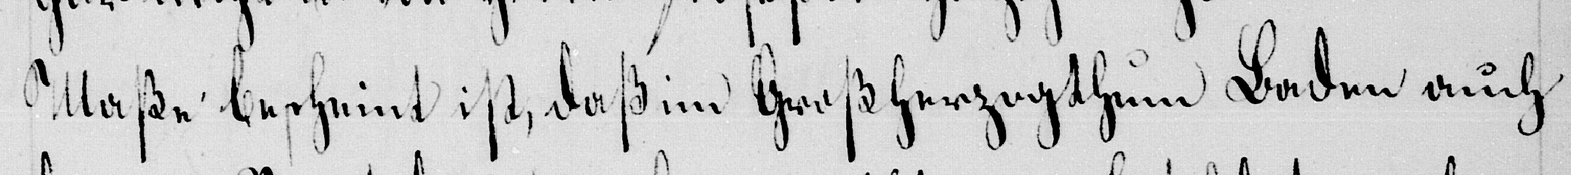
Maße bescheint ist, daß im Großherzogthum Baden auch
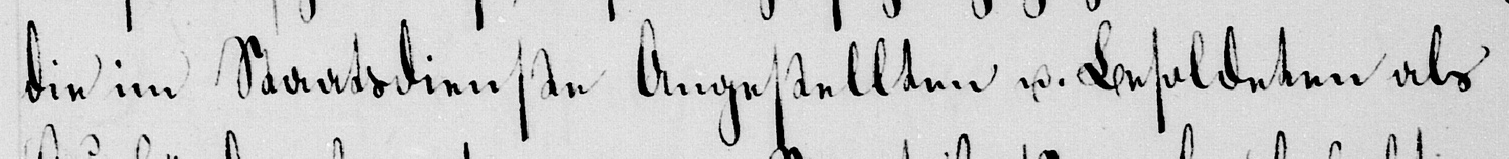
die im Staatsdienste Angestellten u. Besoldeten als
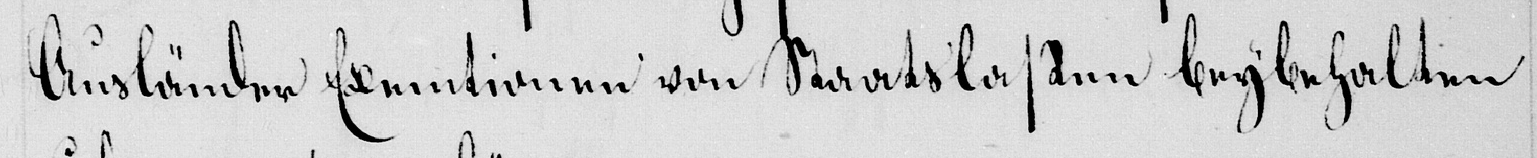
Ausländer Exemtionen von Staatslasten beybehalten
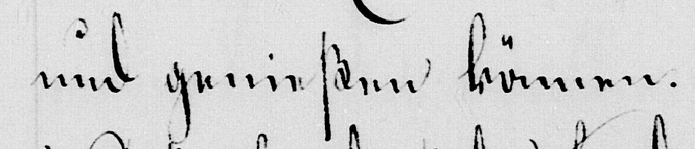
und genießen können.
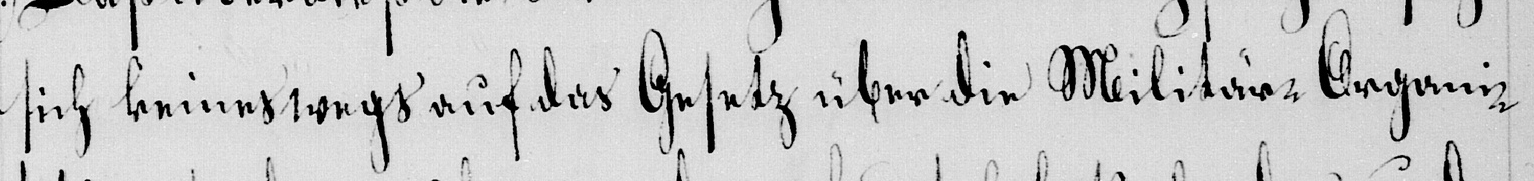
sich keineswegs auf das Gesetz über die Militär-Organi¬
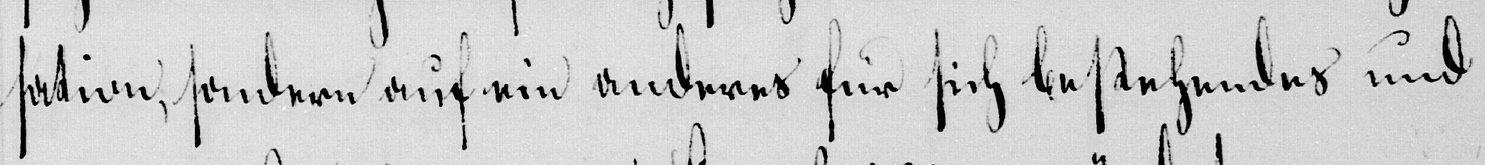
sation, sondern auf ein anderes für sich bestehendes und
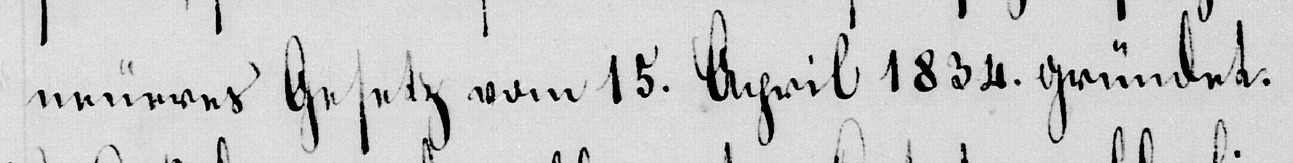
neueres Gesetz vom 15. April 1834. gründet.
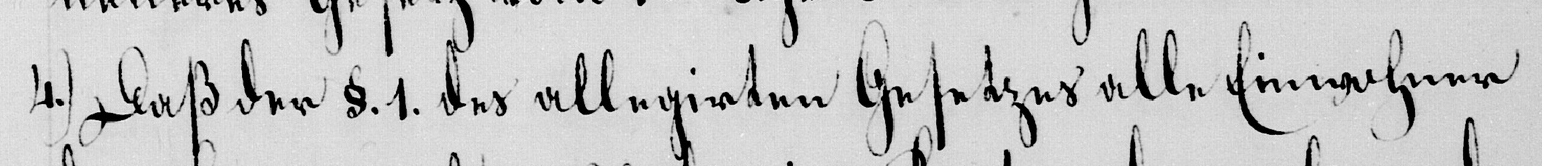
4.) Daß der §. 1. des allegirten Gesetzes alle Einwohner
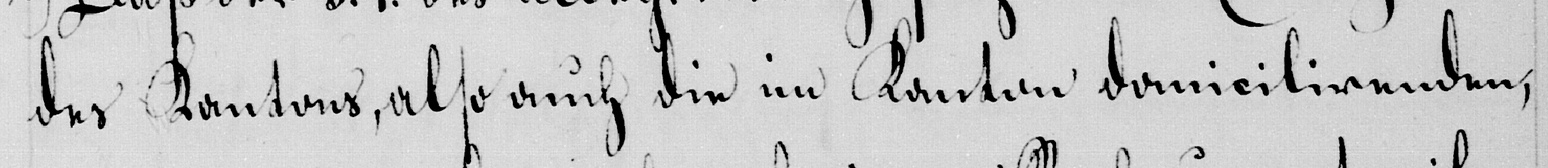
des Kantons, also auch die im Kanton domicilirenden,
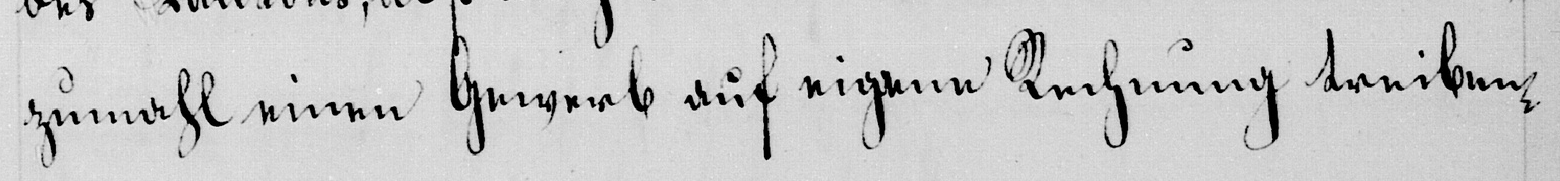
zumahl einen Gewerb auf eigene Rechnung treiben-
